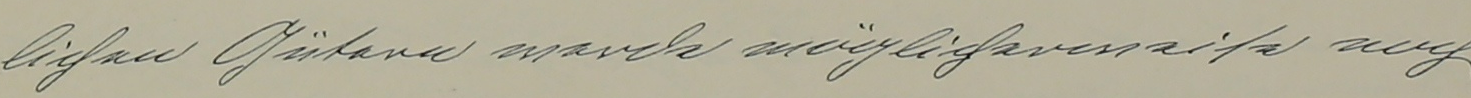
lichen Gütern werde möglicherweise noch
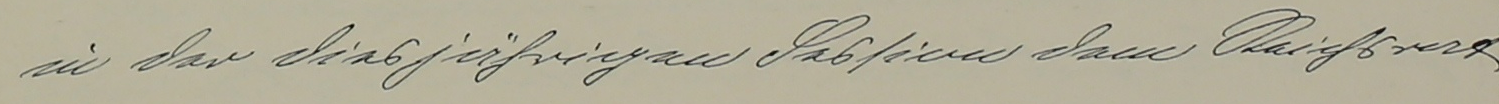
in der diesjährigen Session dem Reichsrat
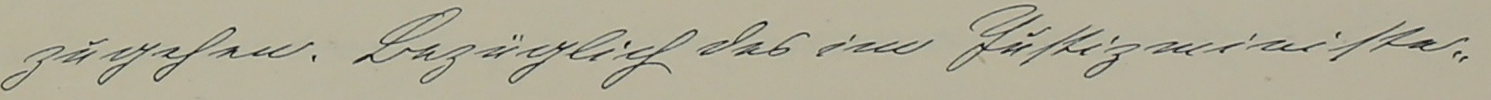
zugehen. Bezüglich des im Justizministe-
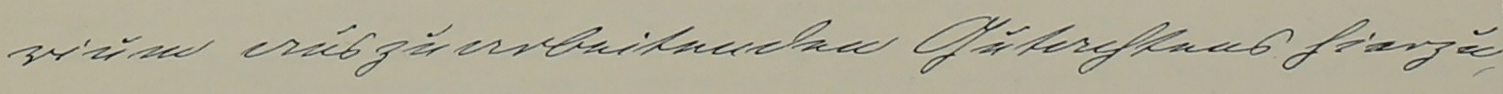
rium auszuarbeitenden Gutachtens hierzu,
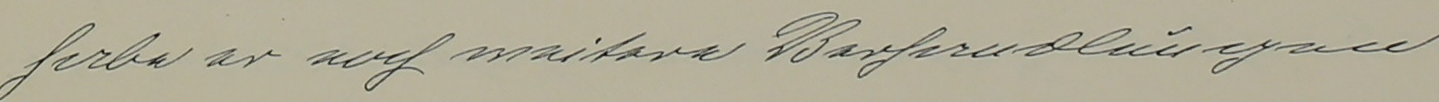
habe er noch weitere Verhandlungen
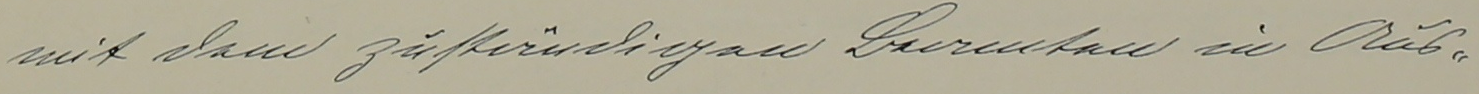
mit dem zuständigen Beamten in Aus-
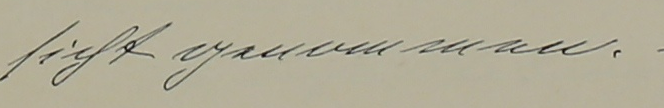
sicht genommen.
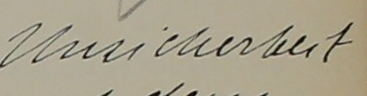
Unsicherheit
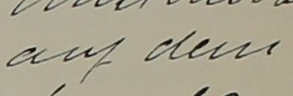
auf dem
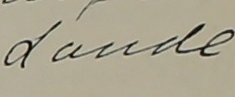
lande
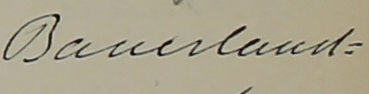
Bauerland-
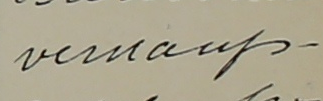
verkaufs-
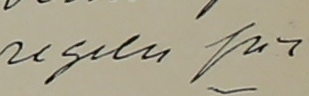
regeln für
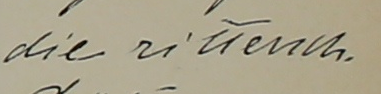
die rittersch.
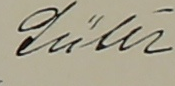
Güter
